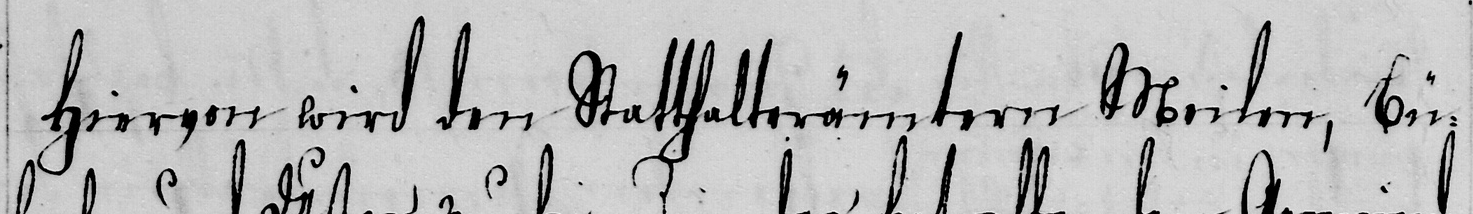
Hiervon wird den Statthalterämtern Meilen, Bü¬
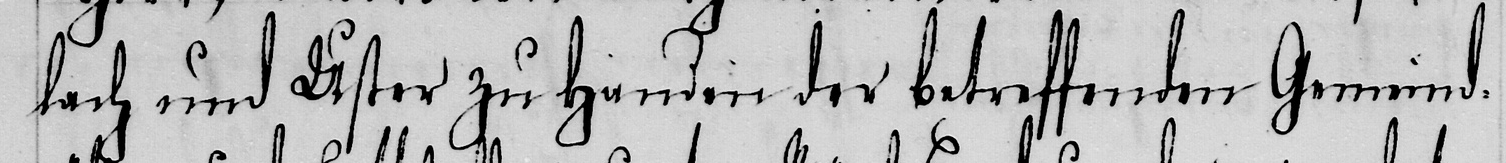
lach und Uster zu Handen der betreffenden Gemeind¬
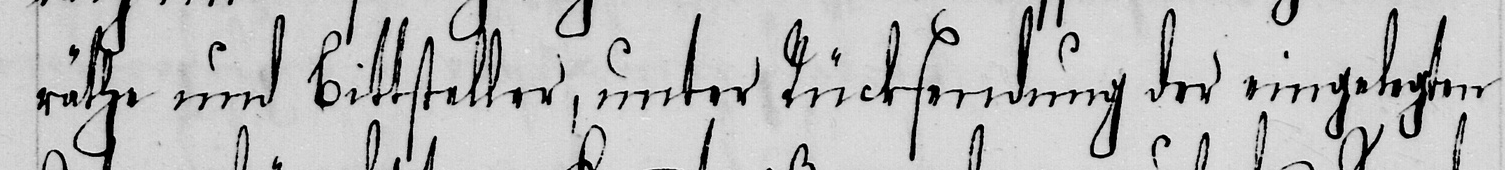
räthe und Bittsteller, unter Rücksendung der eingelegten
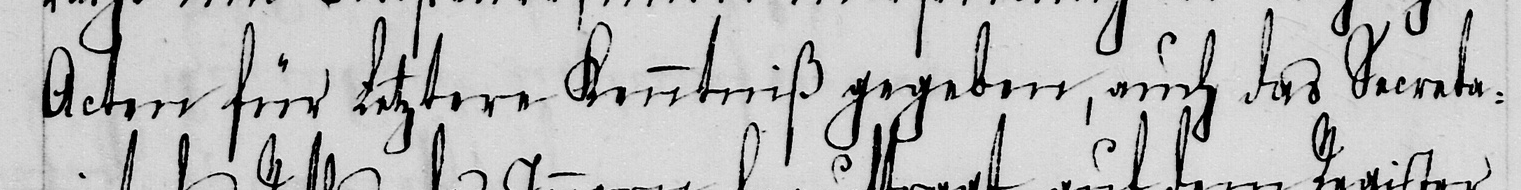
Acten für Letztere Kenntniß gegeben, auch das Secreta¬
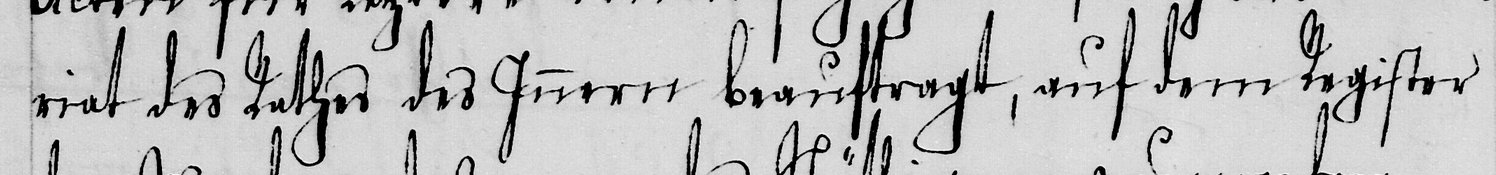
riat des Rathes des Innern beauftragt, auf dem Register
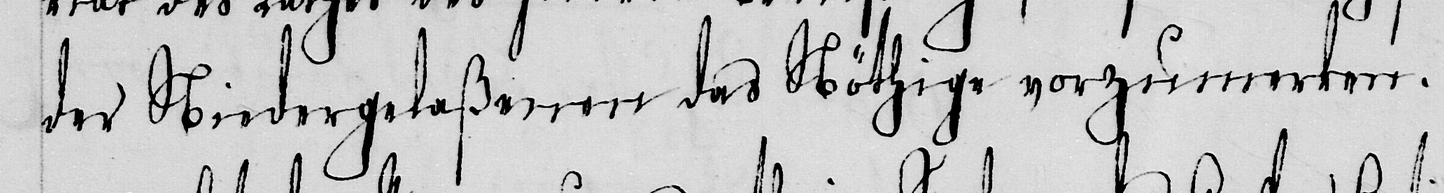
der Niedergelaßenen das Nöthige vorzumerken.
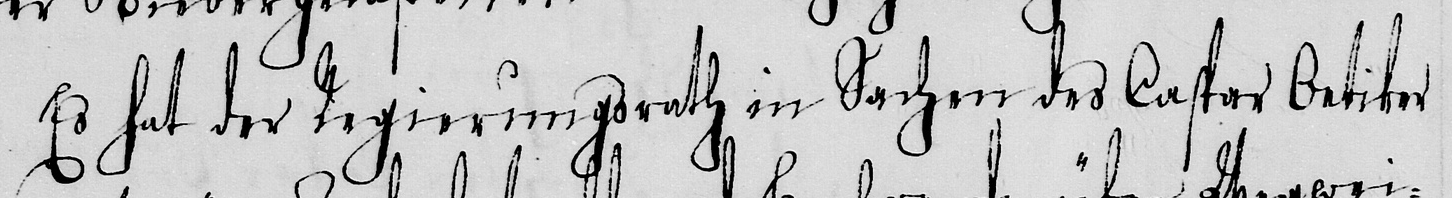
Es hat der Regierungsrath in Sachen des Caspar Oetiker
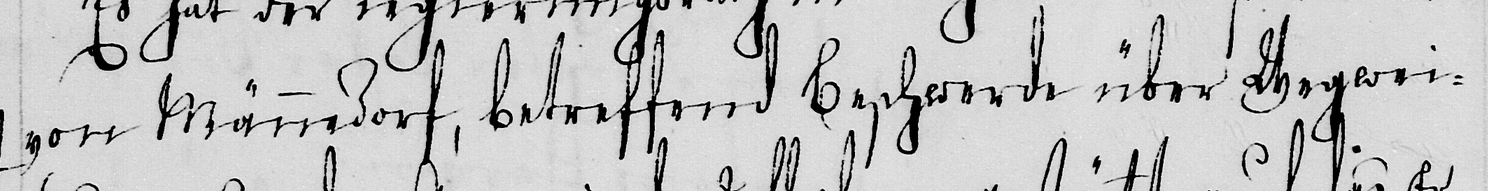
von Männedorf, betreffend Beschwerde über Wegwei¬
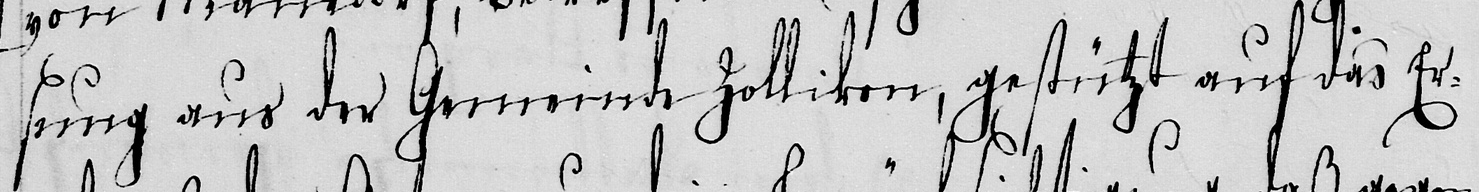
sung aus der Gemeinde Zollikon, gestützt auf das Er¬
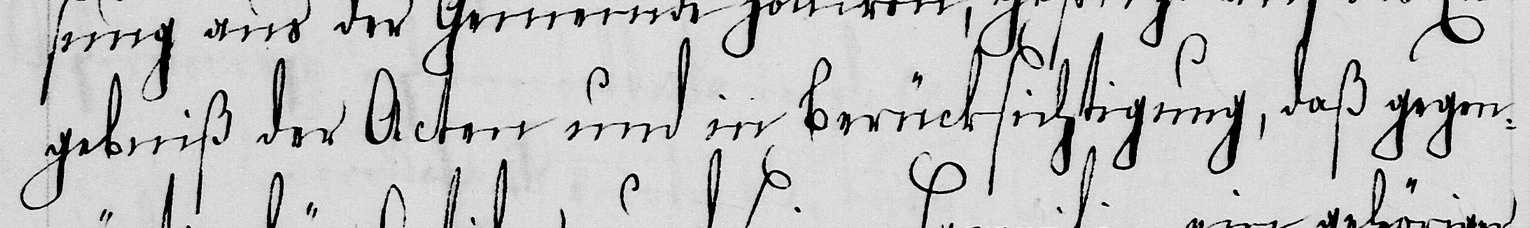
gebniß der Acten und in Berücksichtigung, daß gegen¬
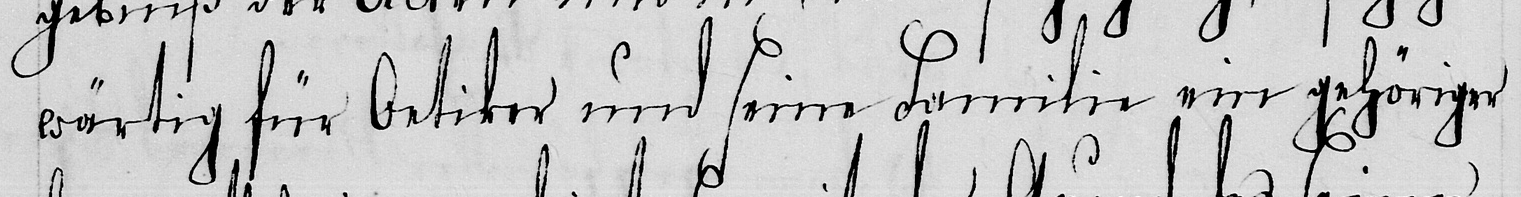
wärtig für Oetiker und seine Familie ein gehöriger
